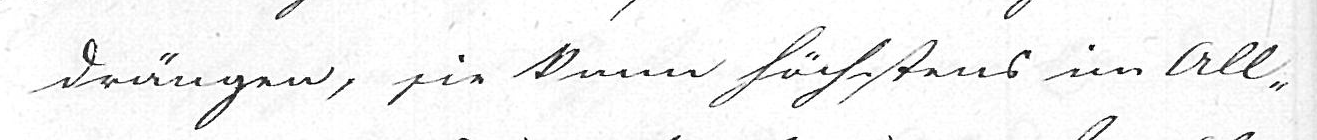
drängen, sie kann höchstens im All-
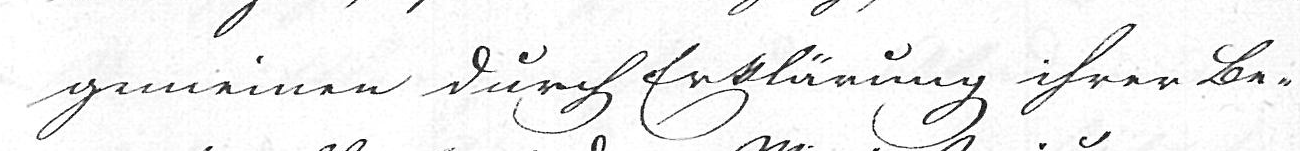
gemeinen durch Erklärung ihrer Be-
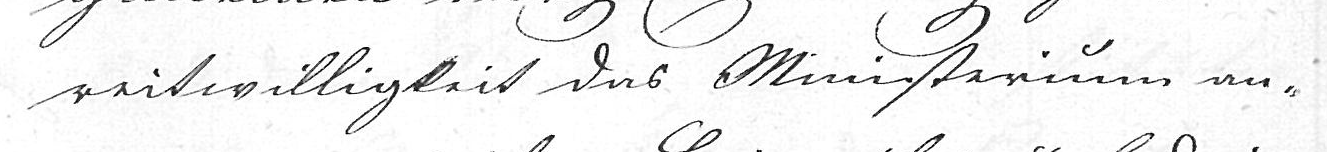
reitwilligkeit das Ministerium an-
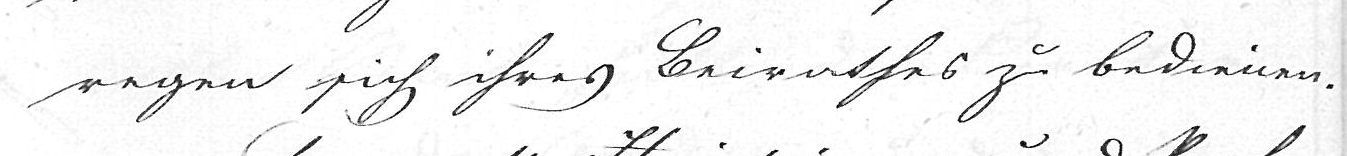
regen sich ihrer Beirathes zu bedienen.
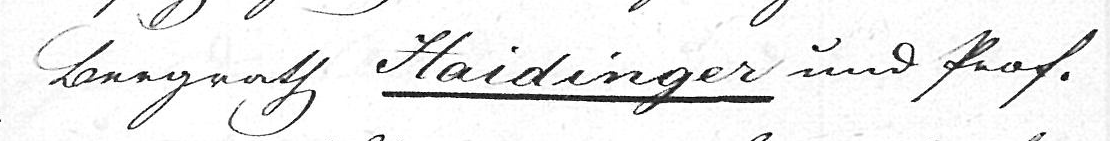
Bergrath Haidinger und Prof.
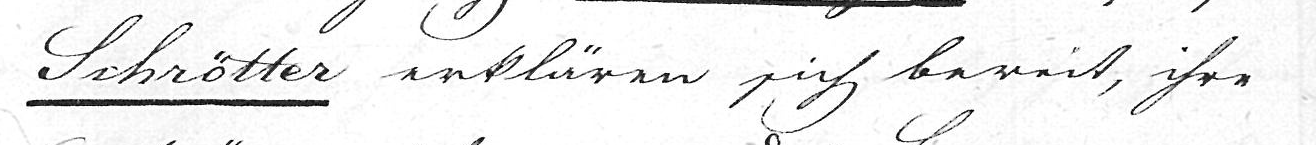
Schrötter erklären sich bereit, ihre
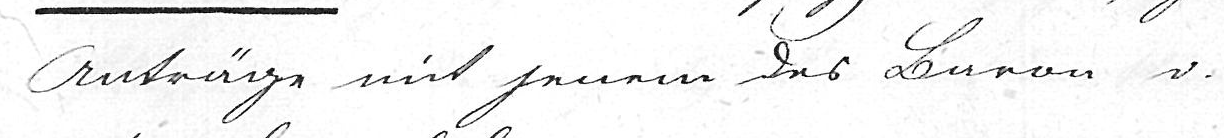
Anträge mit jenem des Baron .
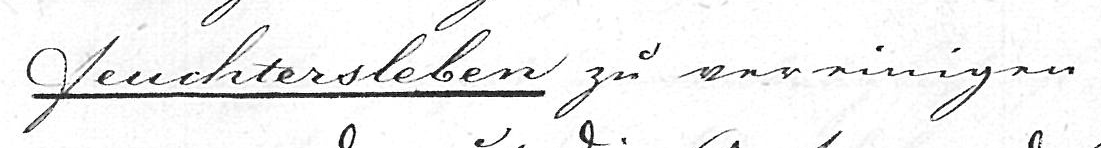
Feuchtersleben zu vereinigen.
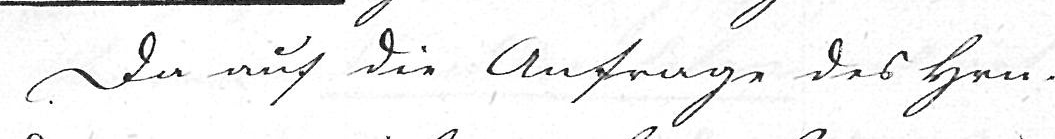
Da auf die Anfrage des Hrn.
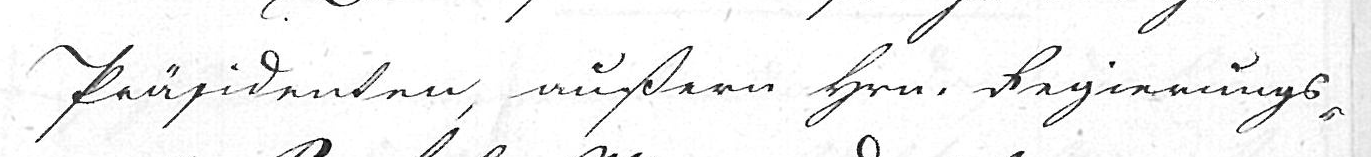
Präsidenten, außer Hrn. Regierungs-
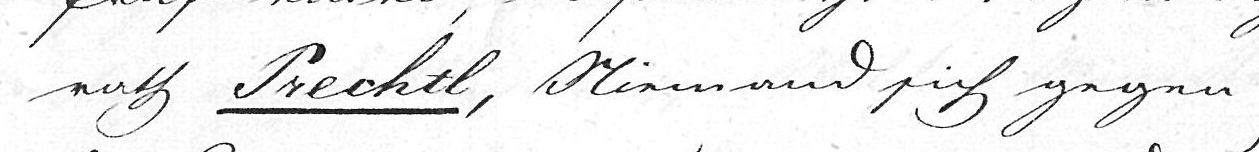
rath Prechtl, Niemand sich gegen
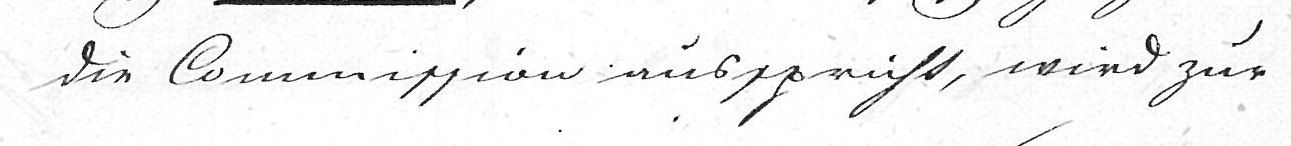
die Commission ausspricht, wird zur
